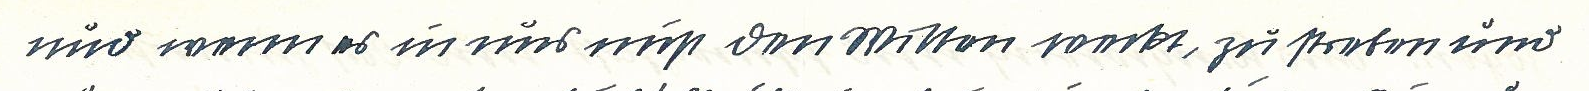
und wenn es in uns nicht den Willen weckt, zu streben und
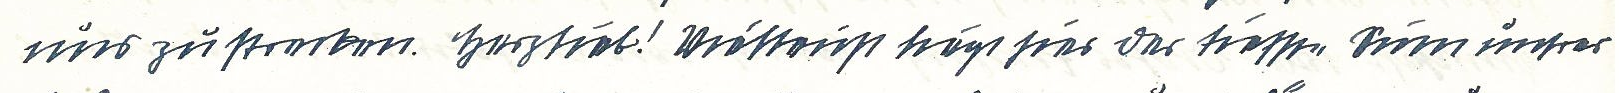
uns zustrecken. Herzlieb! Vielleicht liegt hier der tiefe Sinn unsrer
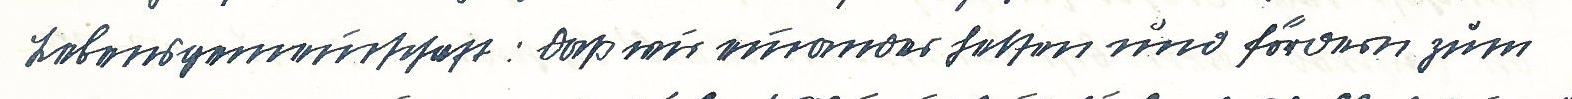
Lebensgemeinschaft: Daß wir einander hetzen und fördern zum
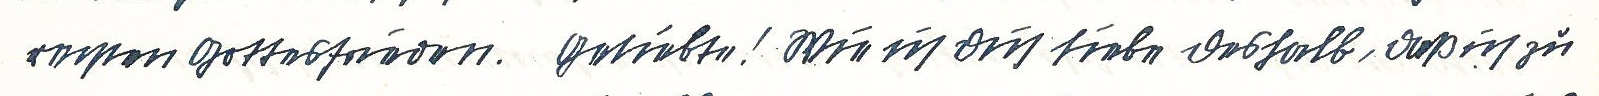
versten Gottesfrieden. Geliebte! Wie ich Dich liebe deshalb, daß ich zu
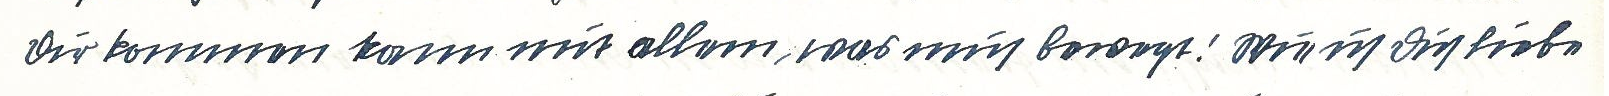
Dir kommen kann mit allem, was mich bewegt! Wie ich Dich liebe
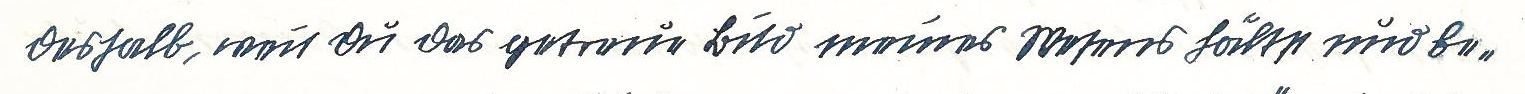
deshalb, weil Du das getreue Bild meines Wesens hältst und be¬
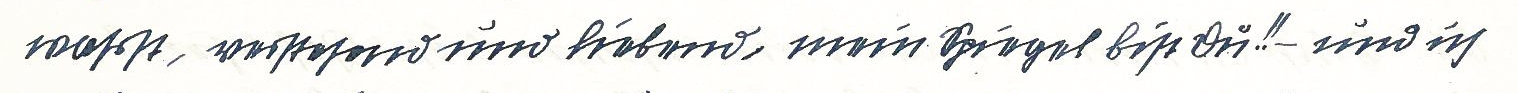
wahrst, verstehend und liebend, mein Spiegel bist Du!! – und ich
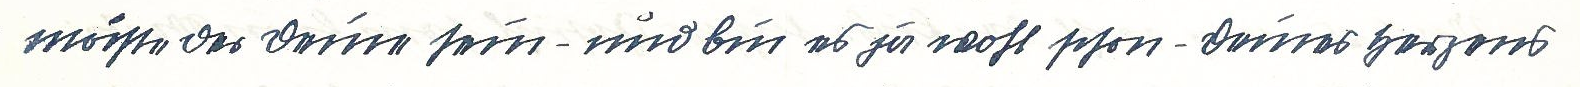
möchte der Deine sein – und bin es ja wohl schon – Deines Herzens
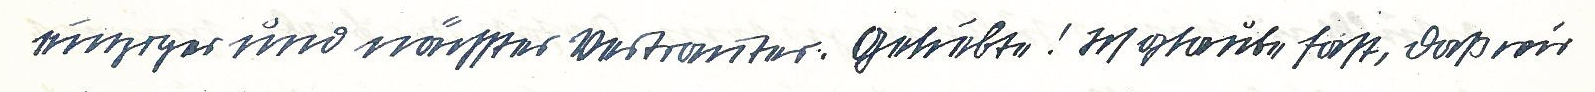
einziger und nächster Vertrauter. Geliebte! Ich glaube fast, daß wir
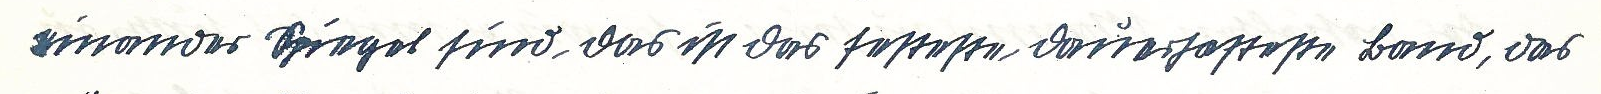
einander Spiegel sind, das ist das festeste dauerhafteste Band, das
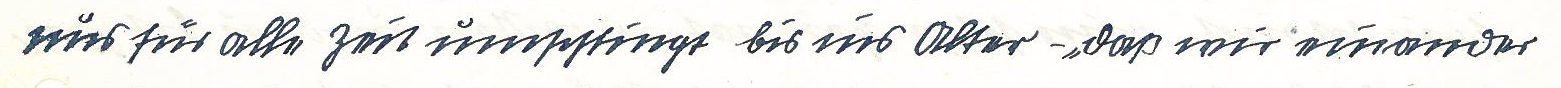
uns für alle Zeit umschlingt bis ins Alter – „daß wir einander
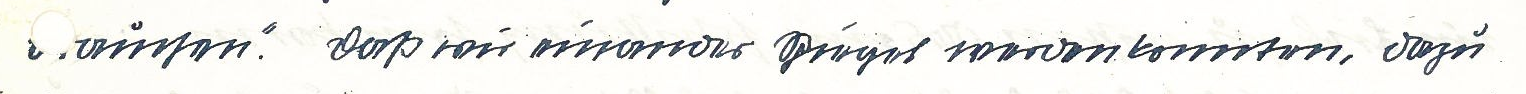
auchen“ Daß wir einander Spiegel werden konnten, dazu
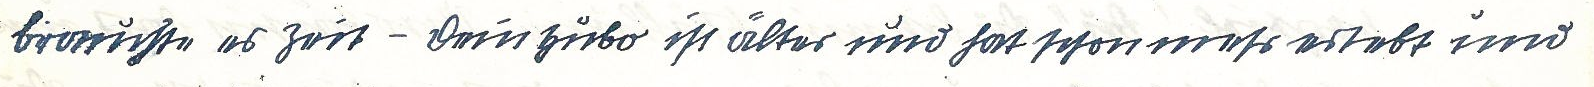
brauchte es Zeit – Dein Hubo ist älter und hat schon mehr erlebt und
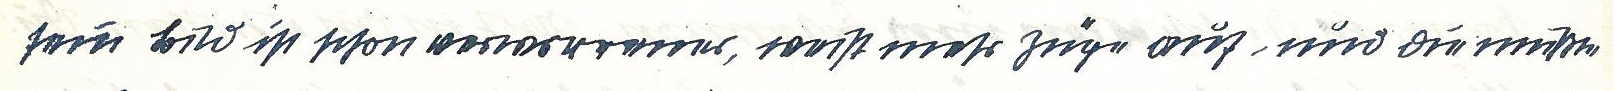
sein Bild ist schon verworrener, weist mehr Züge auf, und die mußte
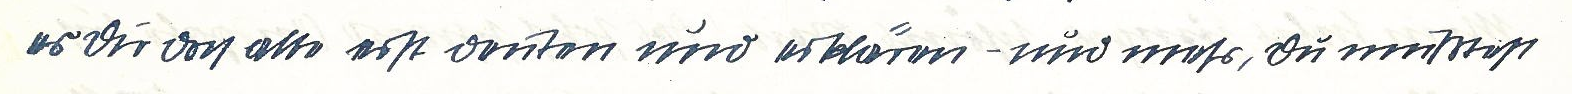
er Dir doch alle erst deuten und erklären – und mehr, Du mußtest
